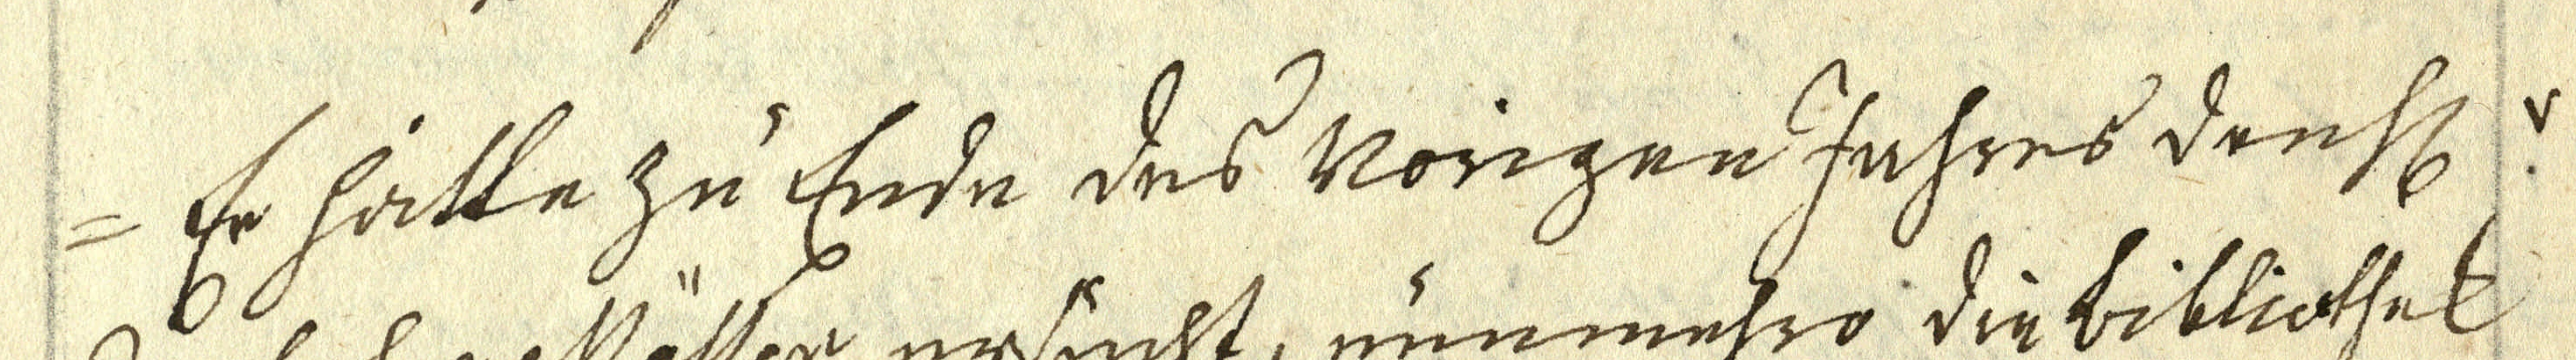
Er hätte zu Ende des vorigen Jahres den h
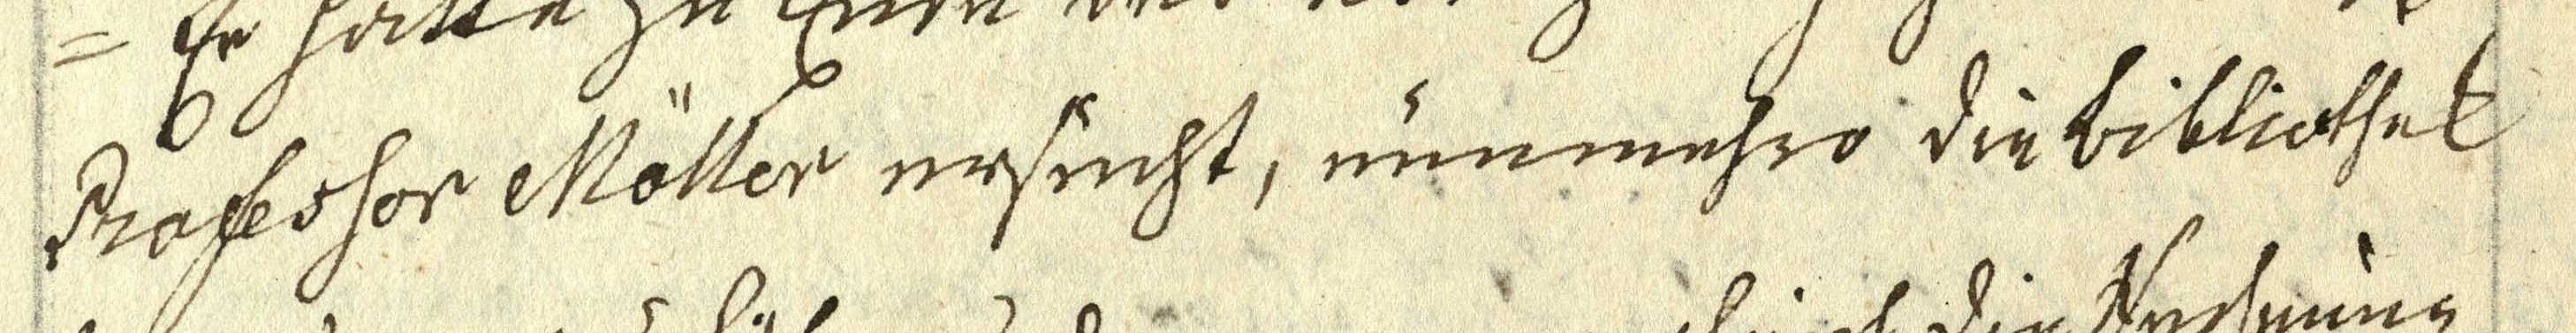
Professor Möller ersucht, nunmehro die Bibliothek
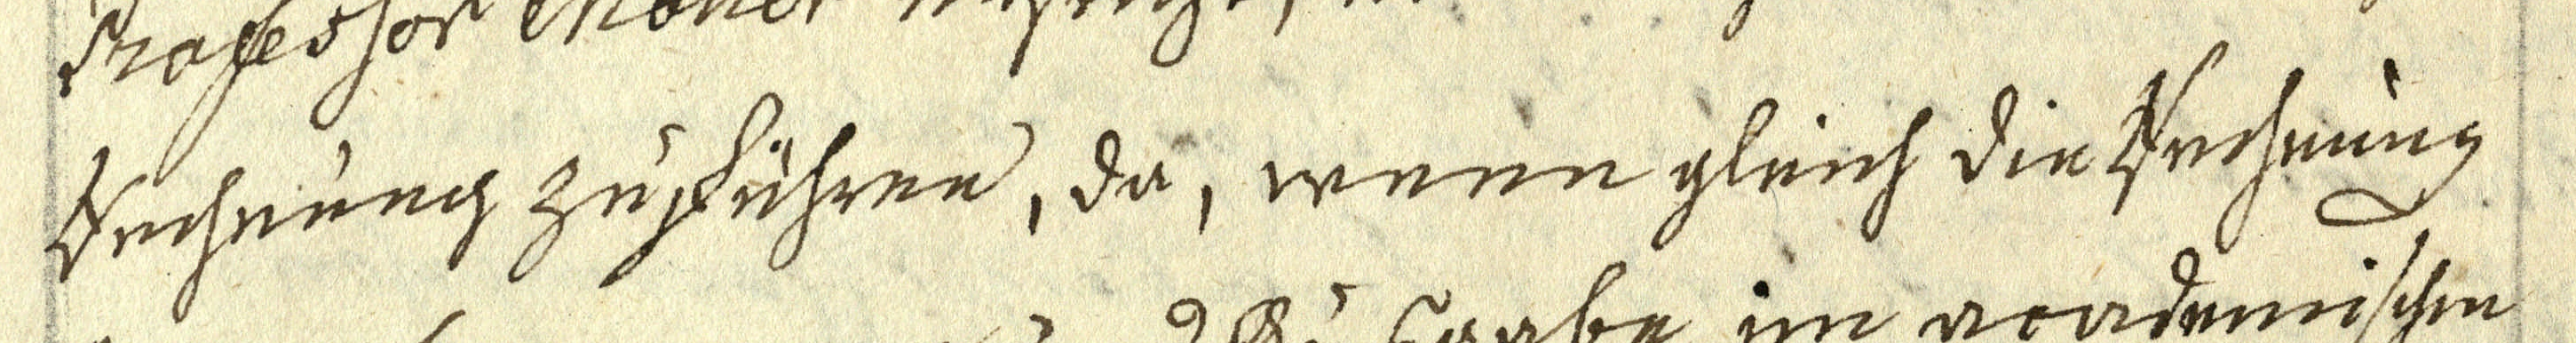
Rechnung zuführen, da, wenn gleich die Rechnung
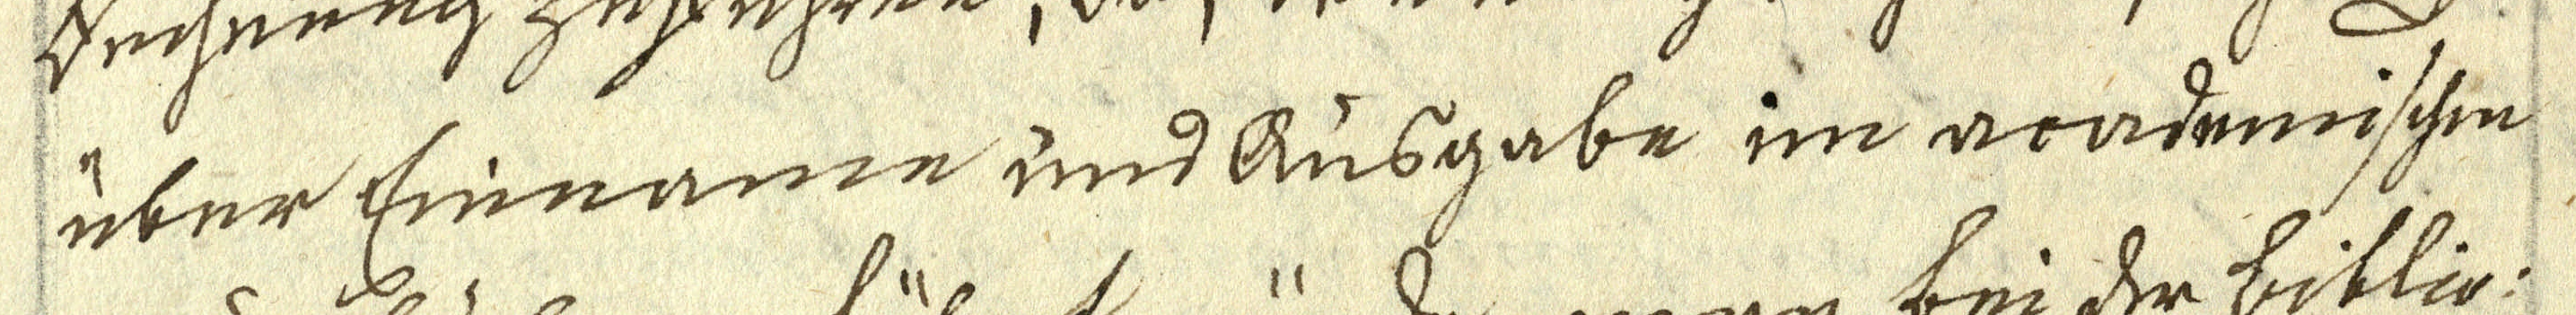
über Einname und Ausgabe im academischen
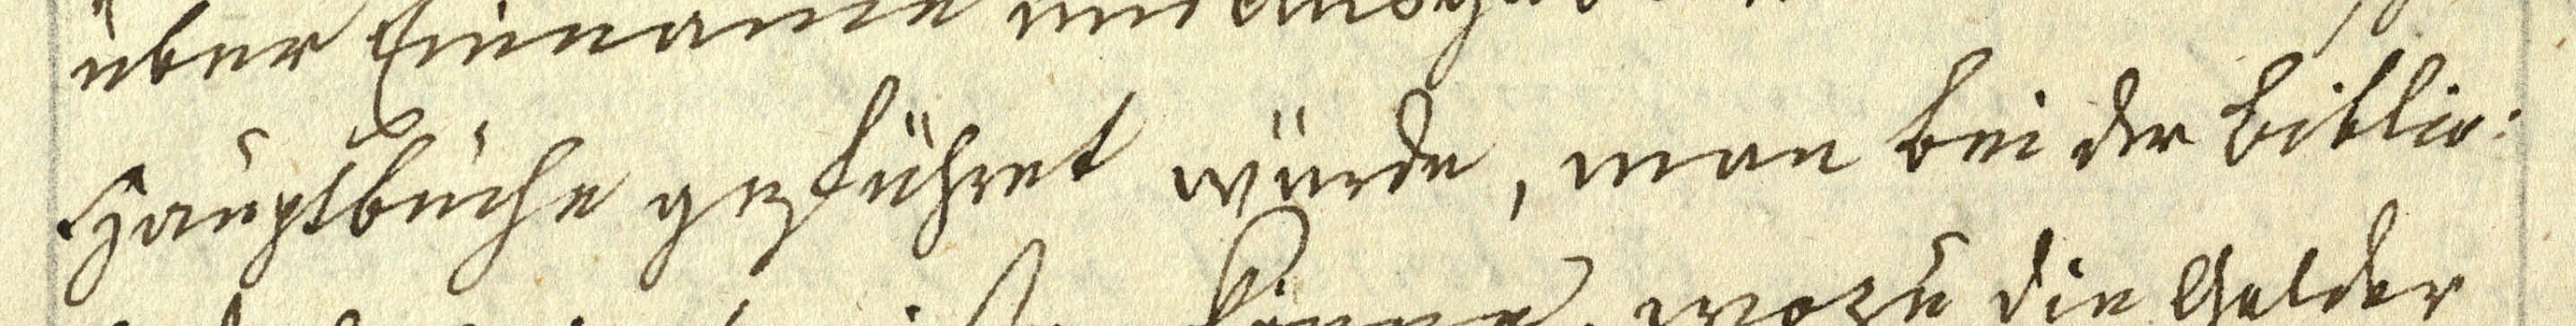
Hauptbuche geführet würde, man bei der Biblio¬
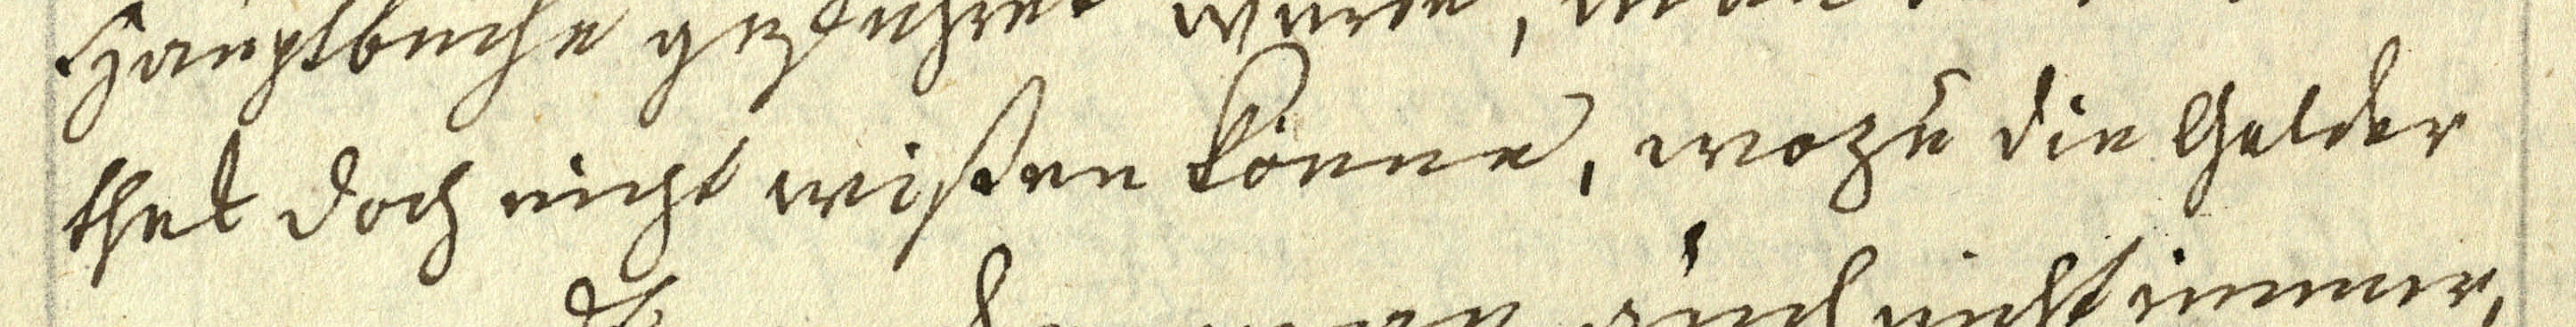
thek doch nicht wißen könne, wozu die Gelder
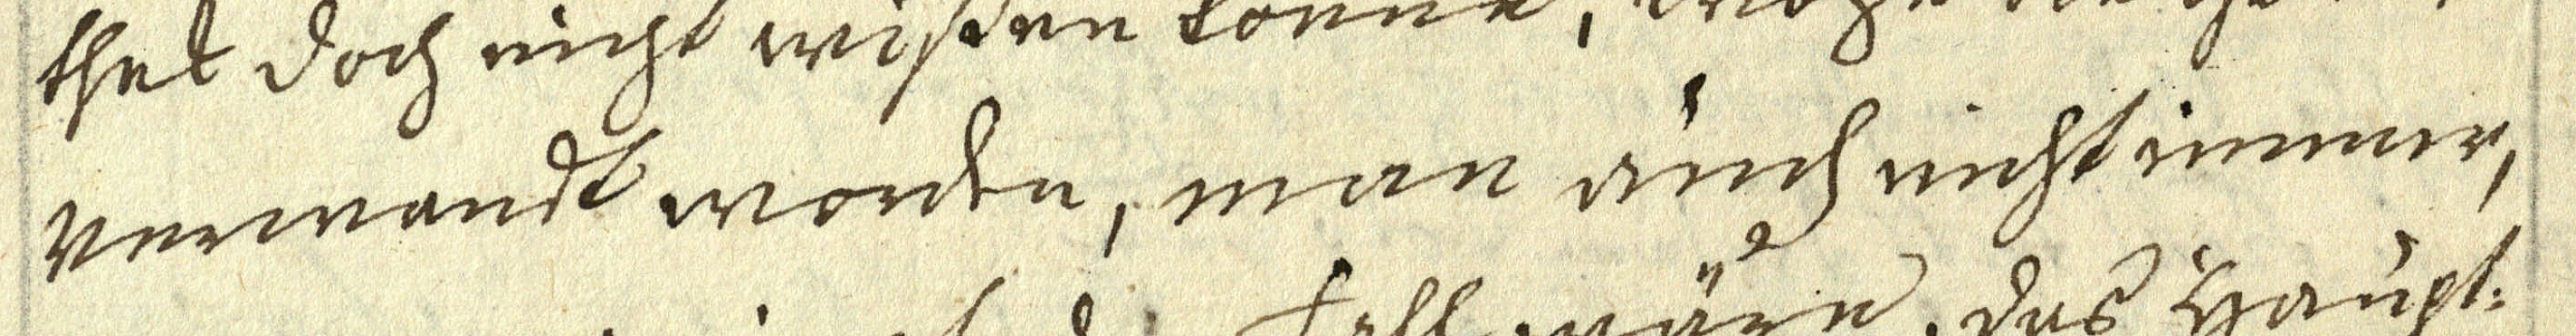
verwandt worden, man auch nicht immer,
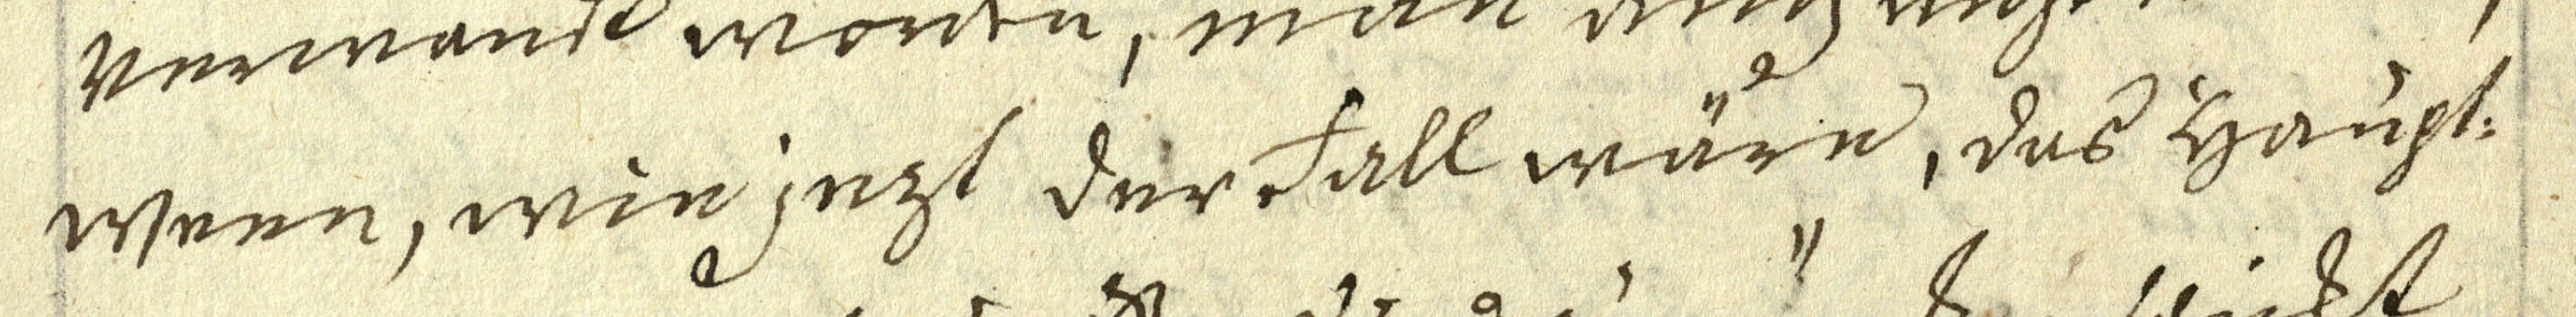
wenn, wie jezt der Fall wäre, das Haupt¬
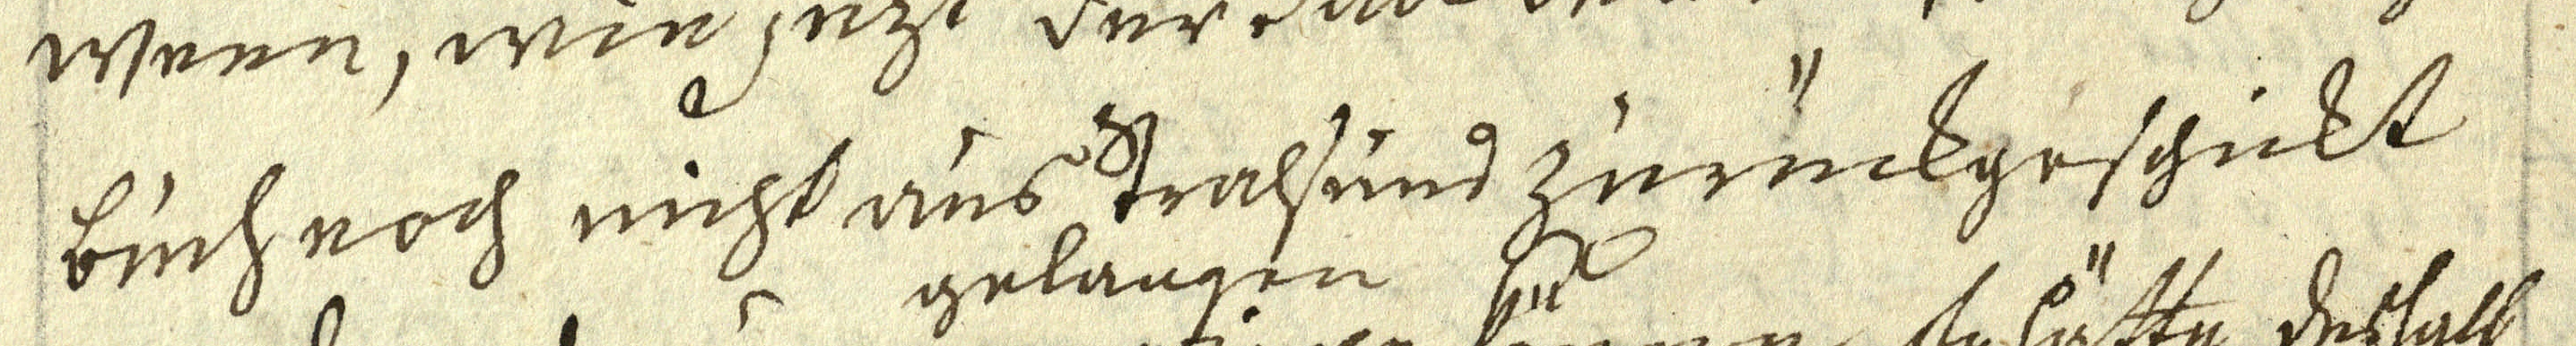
Buch noch nicht aus Stralsund zurückgeschickt
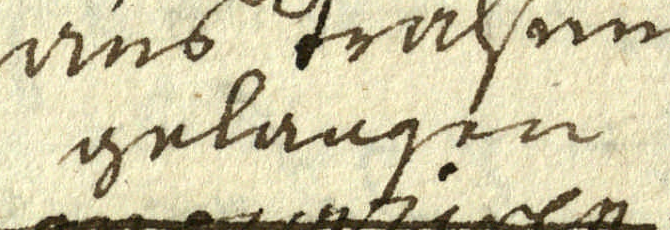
gelangen
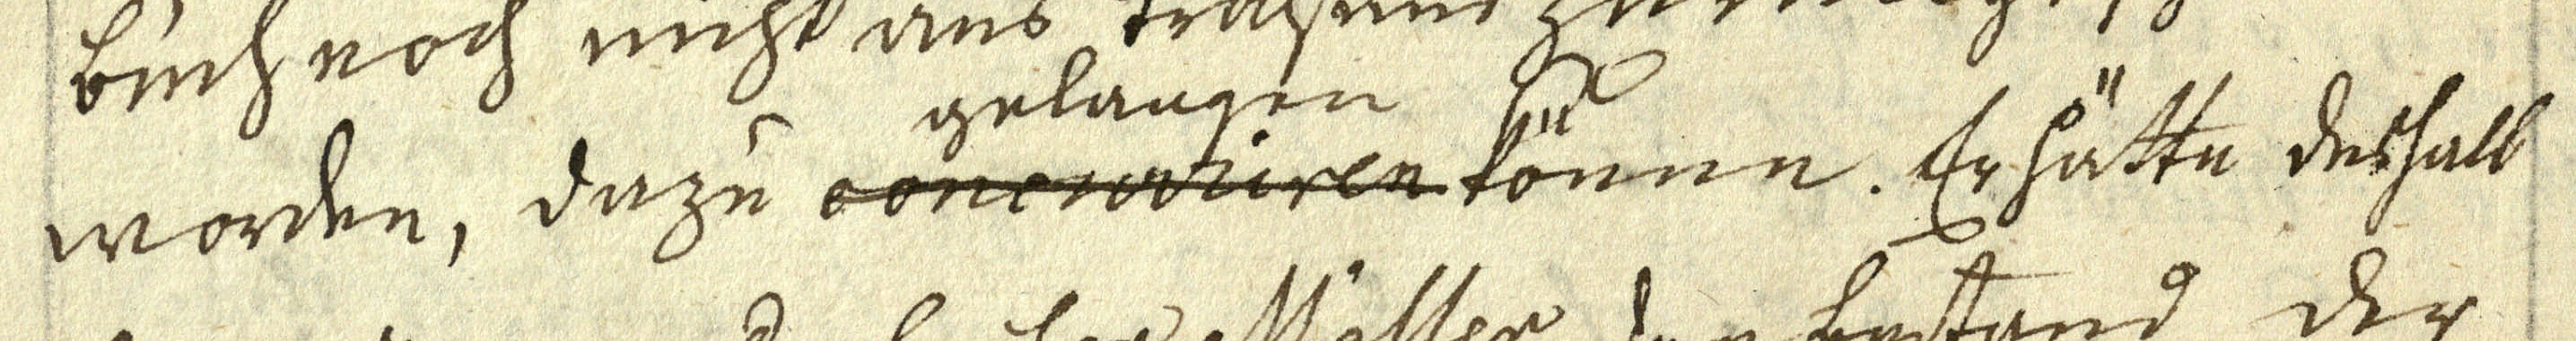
worden, dazu concuriren könne. Er hätte deshalb
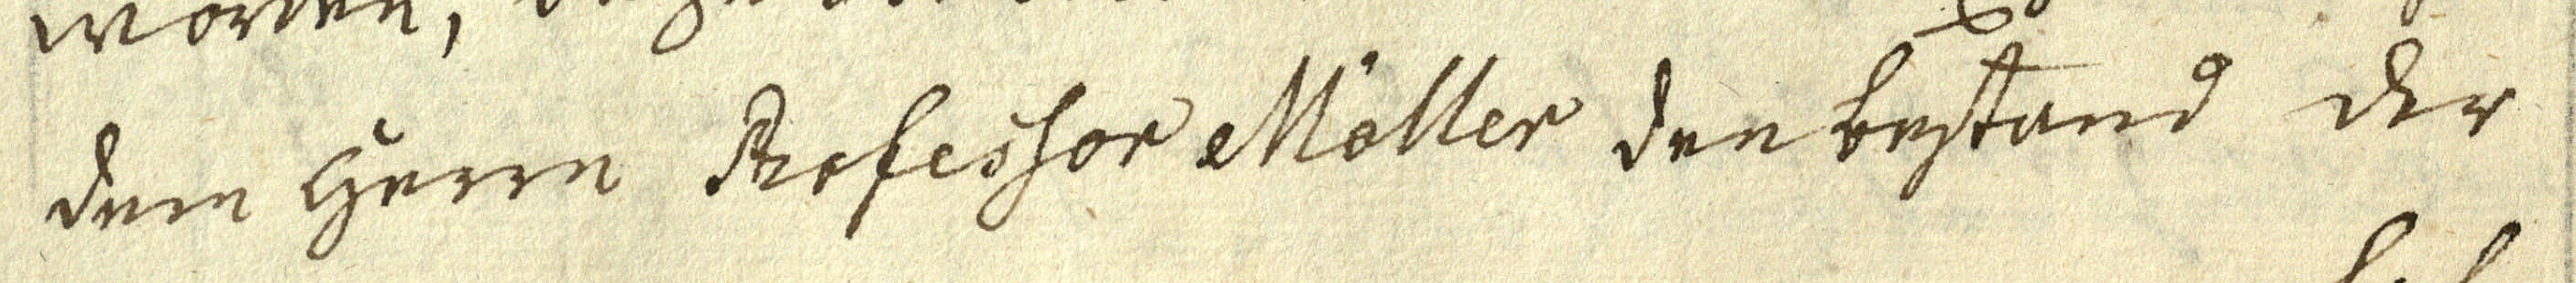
dem Herrn Professor Möller den Bestand der
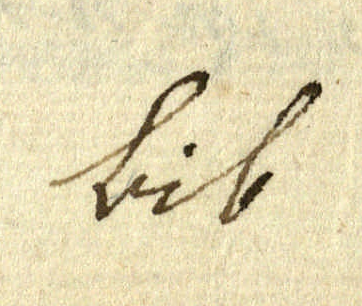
Bib
